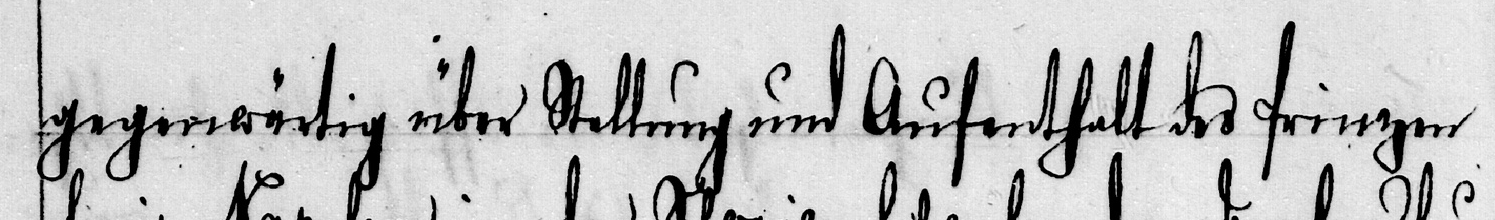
gegenwärtig über Stellung und Aufenthalt des Prinzen
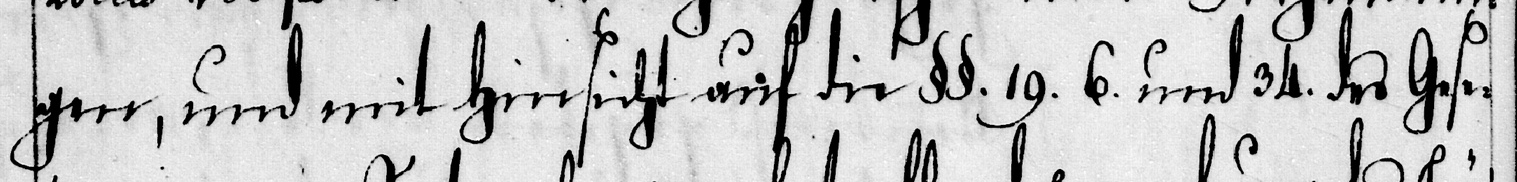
gen, und mit Hinsicht auf die §§. 19. 6. und 34. des Gese¬
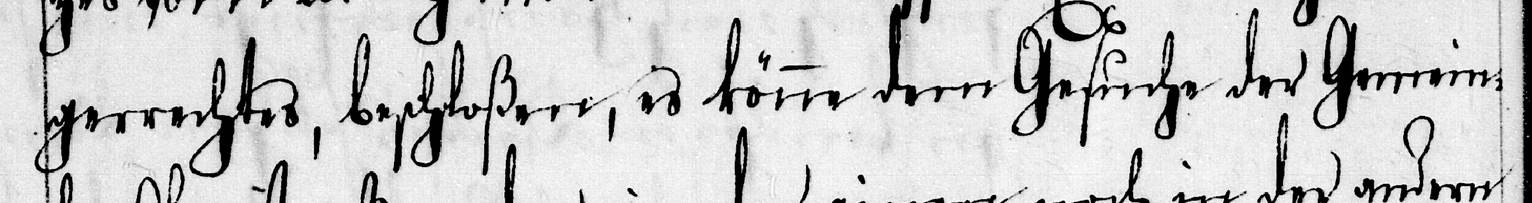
gerrechtes, beschloßen, es könne dem Gesuche der Gemein¬
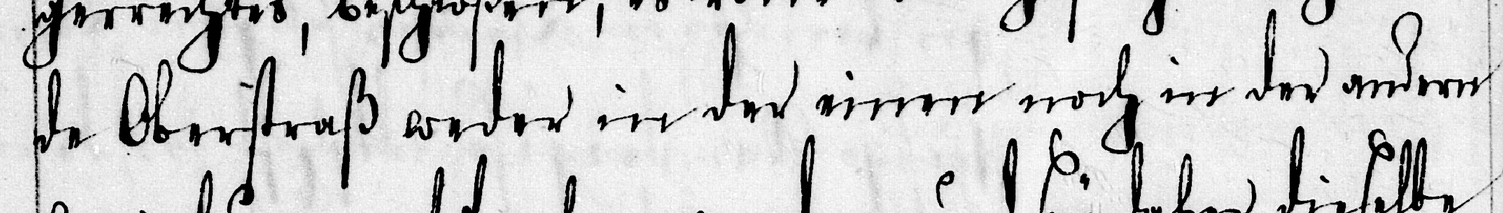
de Oberstraß weder in der einen noch in der andern
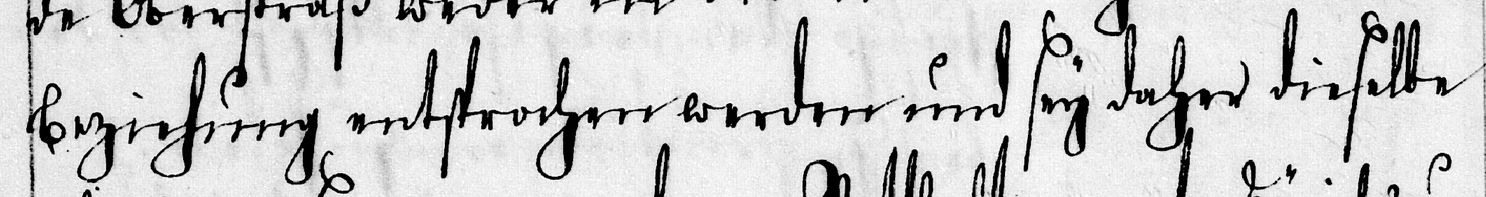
Beziehung entsprochen werden und sey daher dieselbe
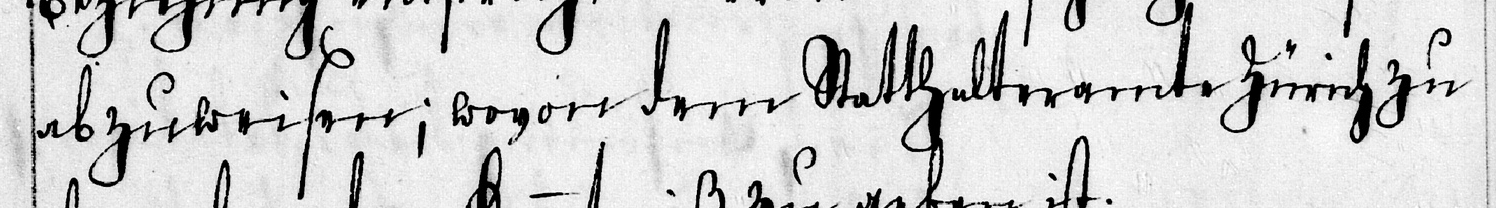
abzuweisen; wovon dem Statthalteramte Zürich zu
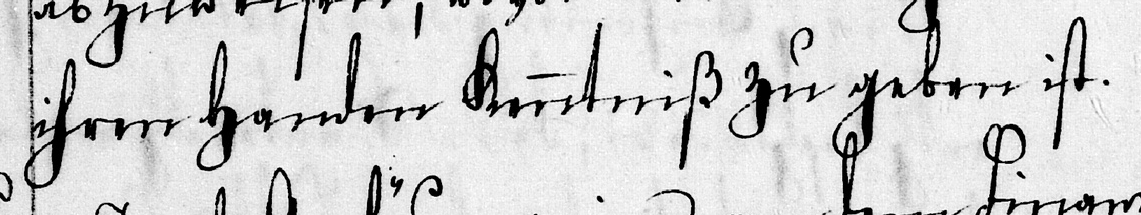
ihren Handen Kenntniß zu geben ist.
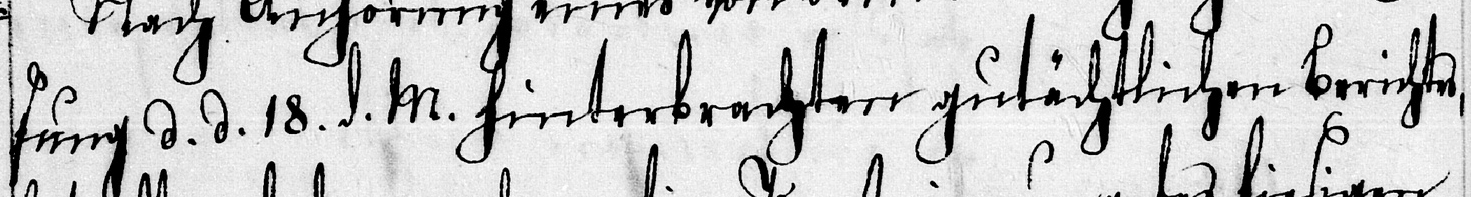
sung d. d. 18. d. M. hinterbrachten gutächtlichen Bericht¬
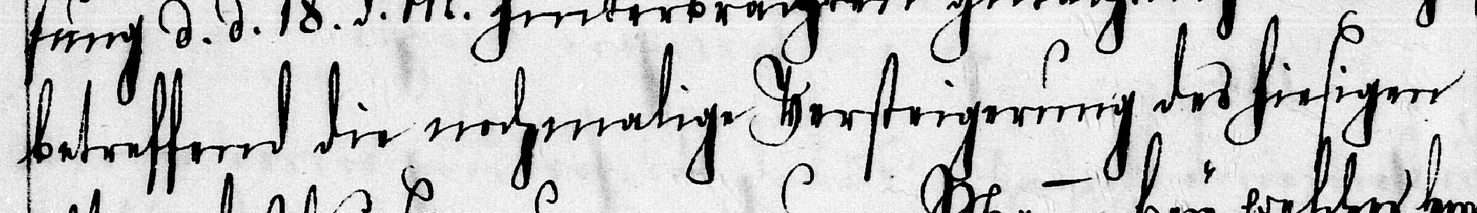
betreffend die nochmalige Versteigerung des hiesigen
